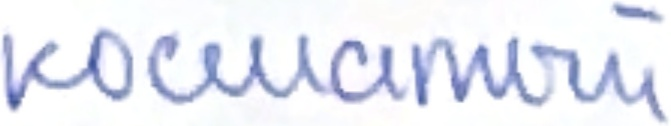косматый
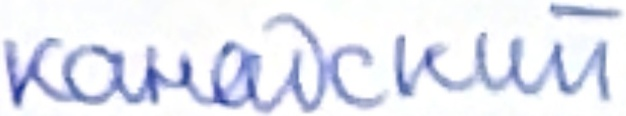канадский
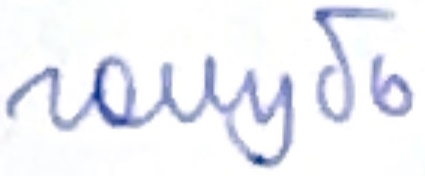голубь
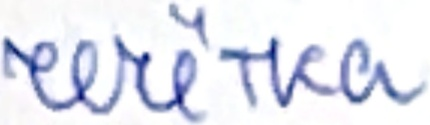чечётка
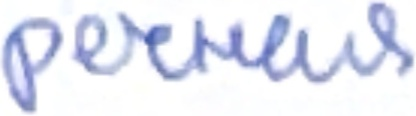речная
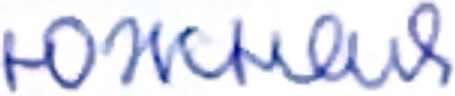южная
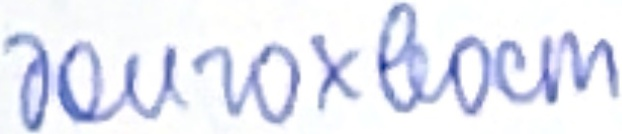долгохвост
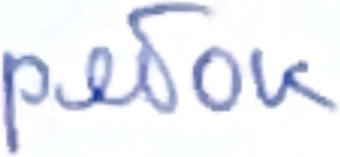рябок
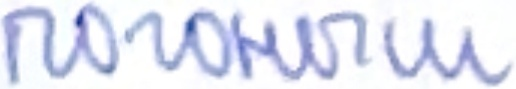погоныш
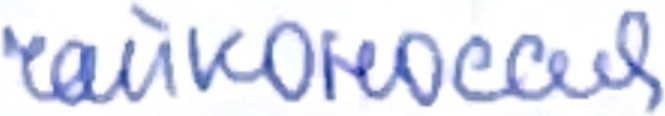чайконосая
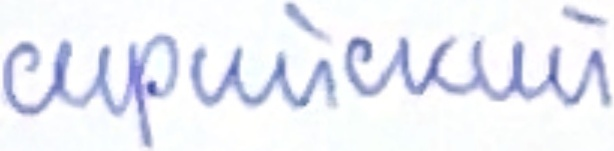сирийский
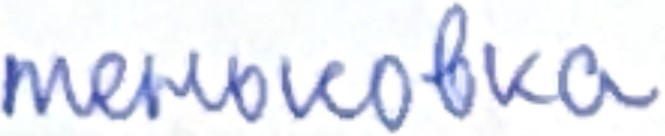теньковка
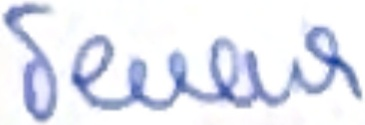белая
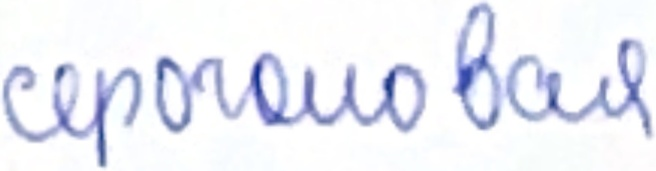сероголовая
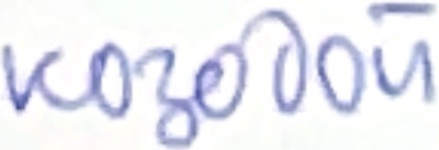козодой
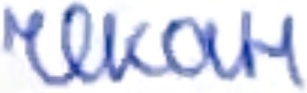чекан
